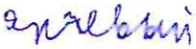арчевый
